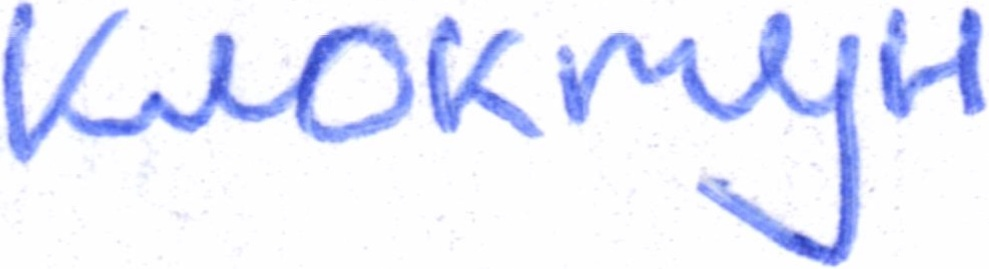клоктун
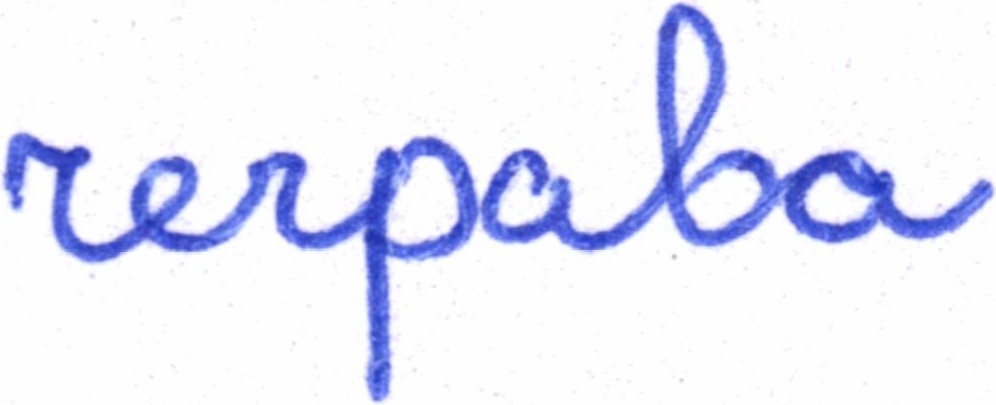чеграва
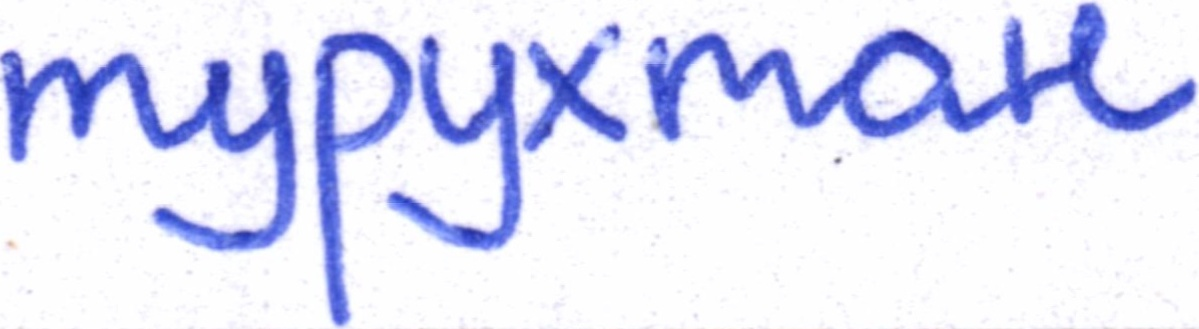турухтан
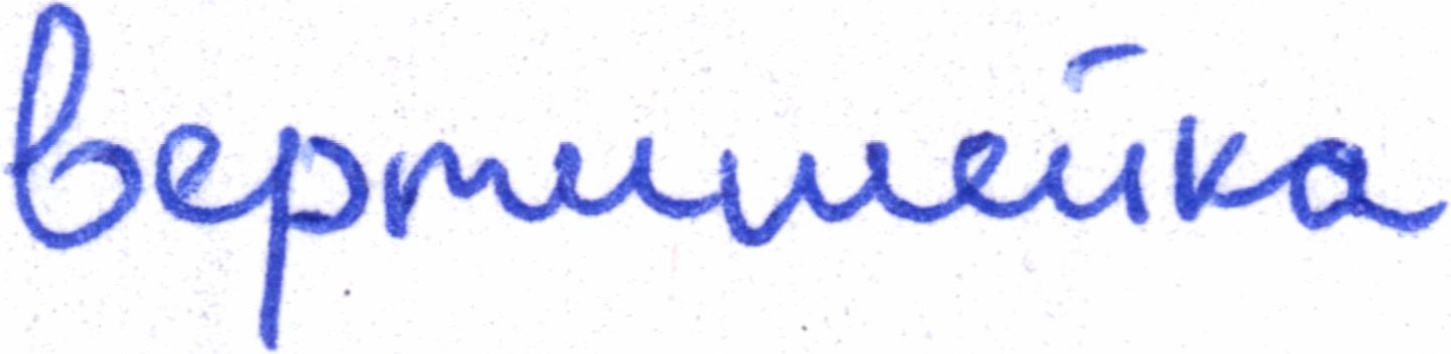вертишейка
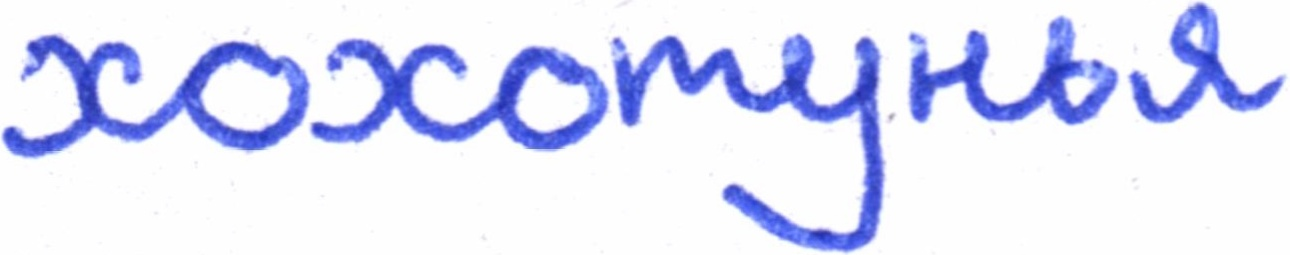хохотунья
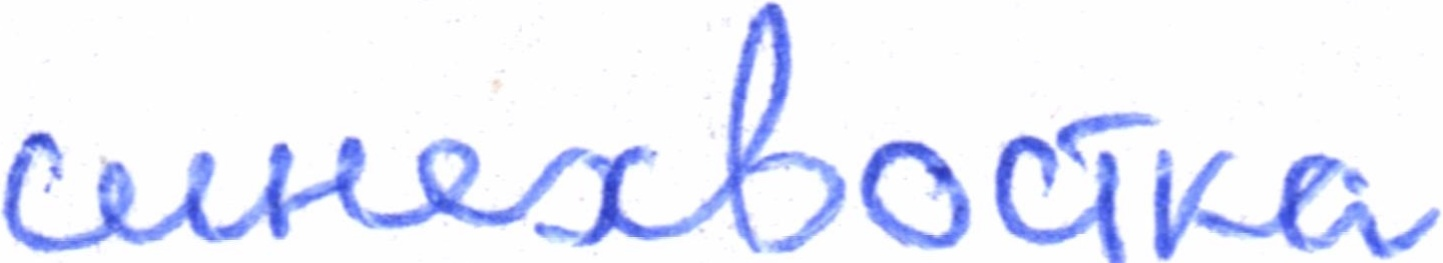синехвостка
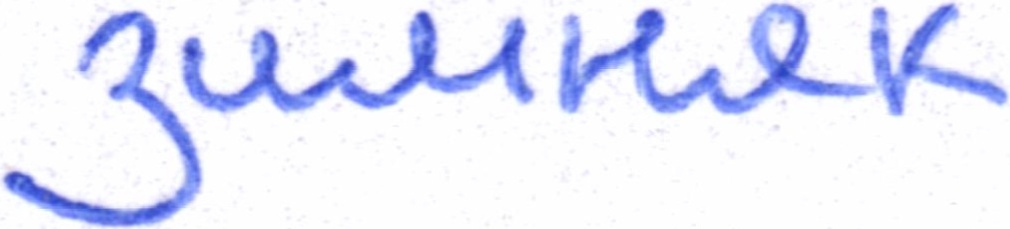зимняк
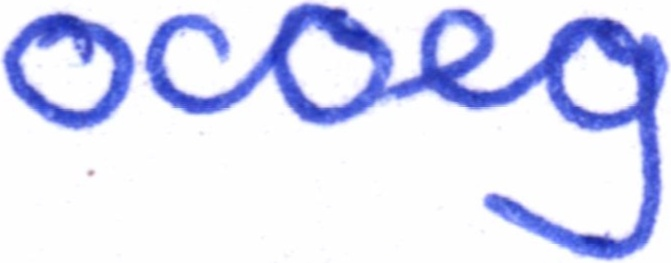осоед
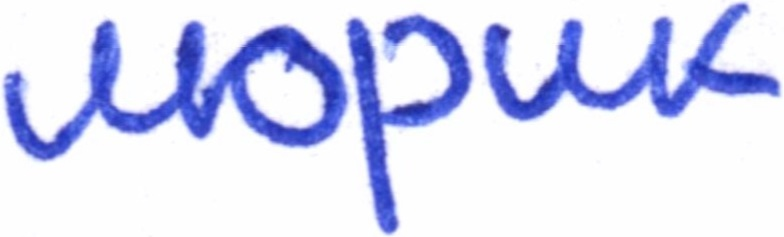люрик
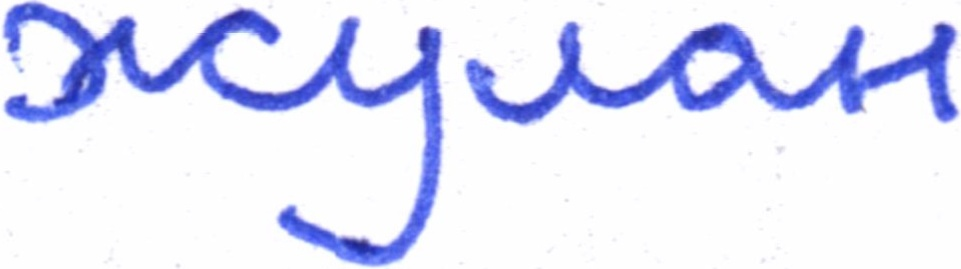жулан
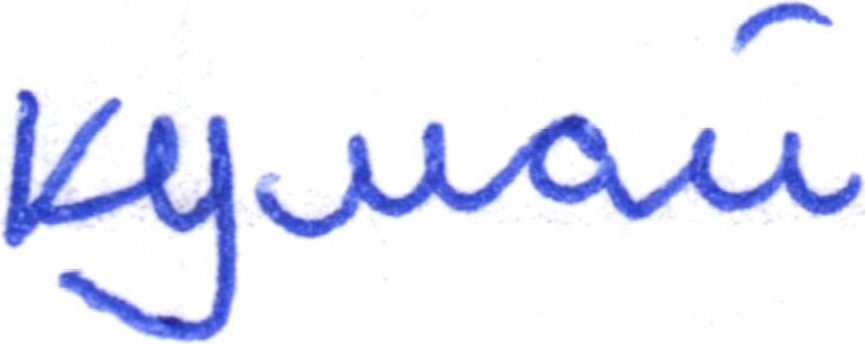кумай
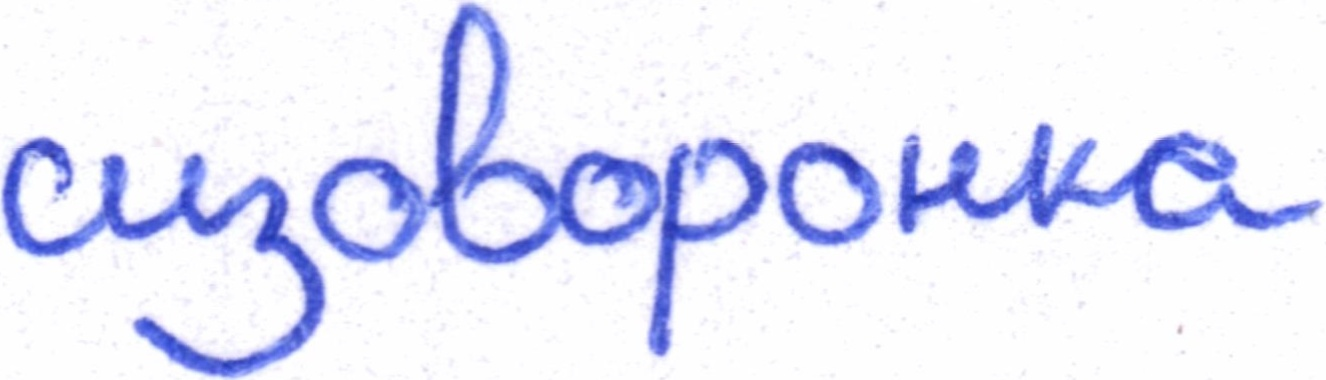сизоворонка
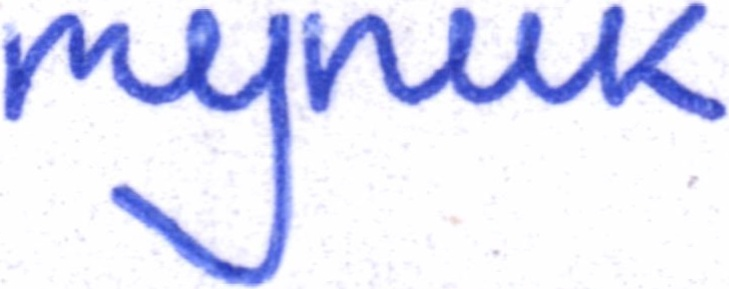тупик
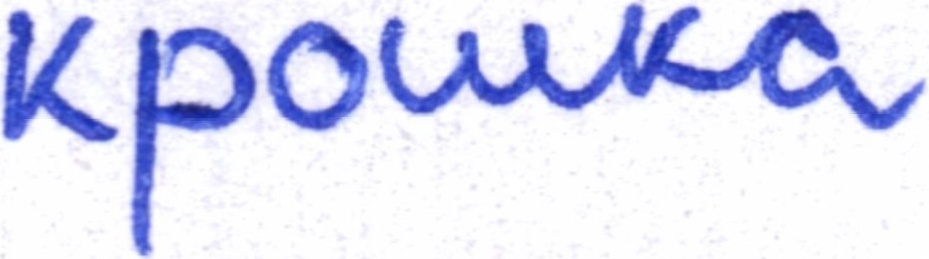крошка
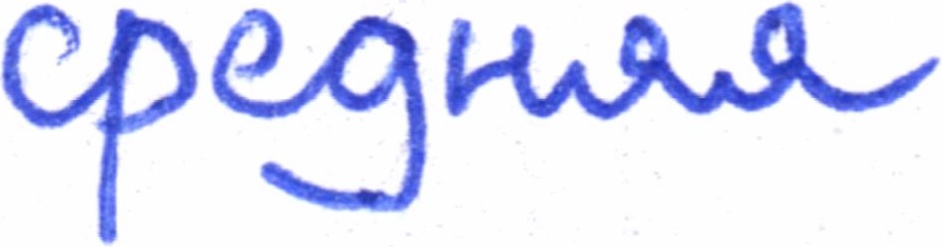средняя
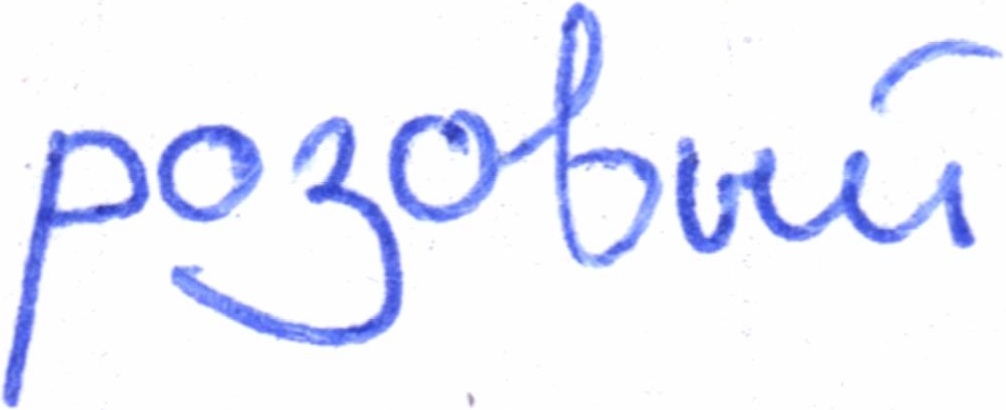розовый
